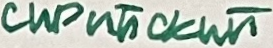сирийский
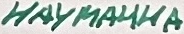науманна
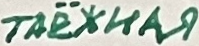таёжная
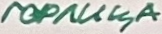горлица
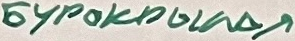бурокрылая
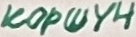коршун
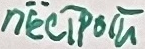пёстрый
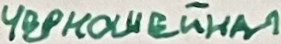черношейная
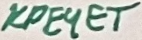кречет
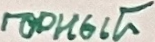горный
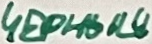черныш
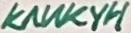кликун
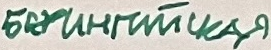берингийская
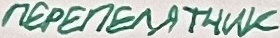перепелятник
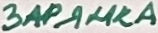зарянка
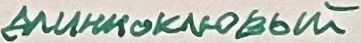длинноклювый
